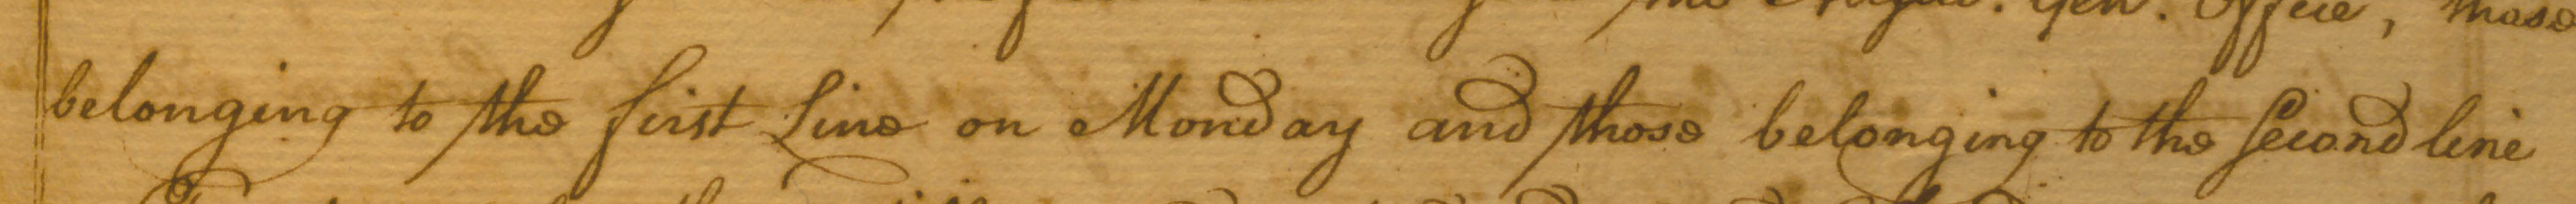belonging to the first Line on Monday and those belonging to the second line
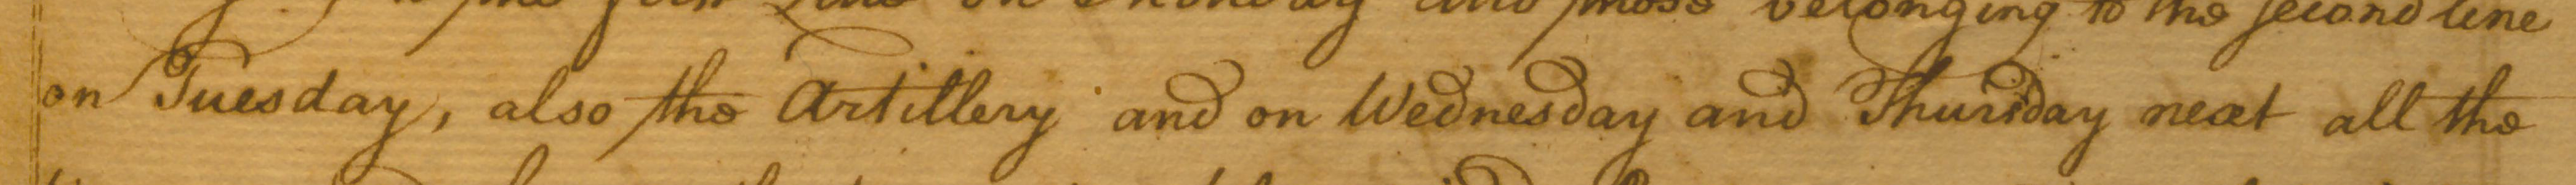on Tuesday, also the artillery and on Wednesday and Thursday next all the
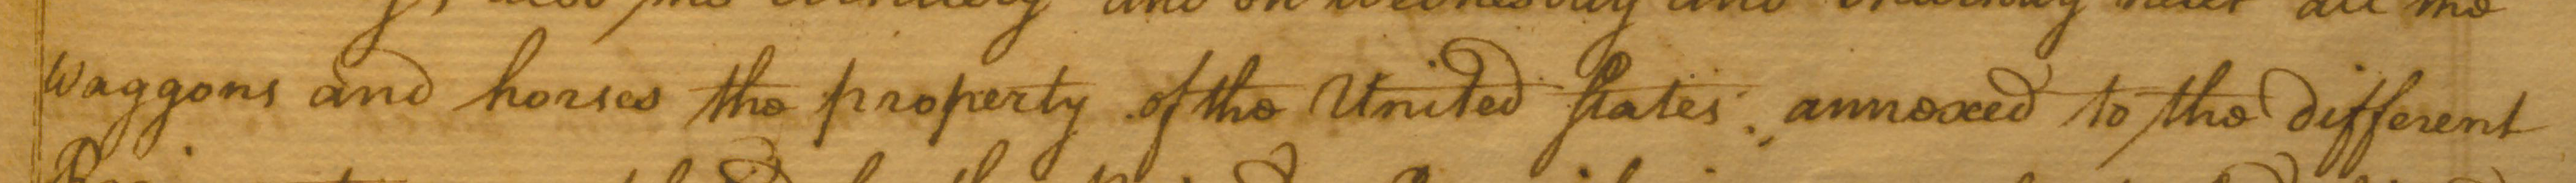waggons and horses the property of the United States. annexed to the different
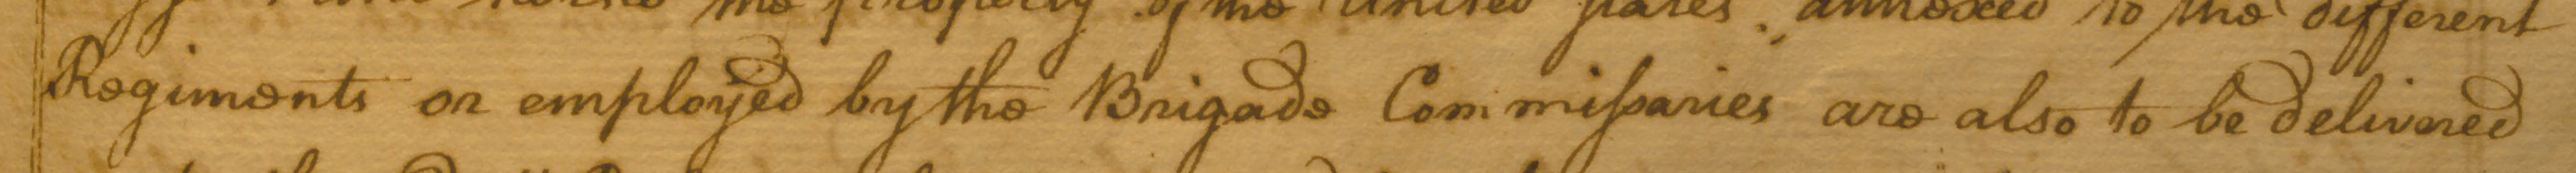Regiments or employed by the Brigade Commissaries are also to be delivered
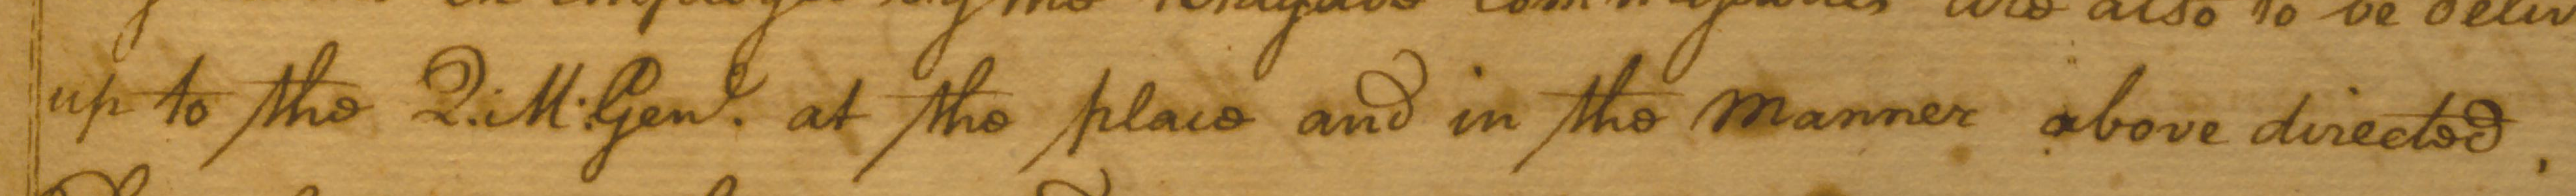up to the Q: M: Gen^l. at the place and in the manner above directed.
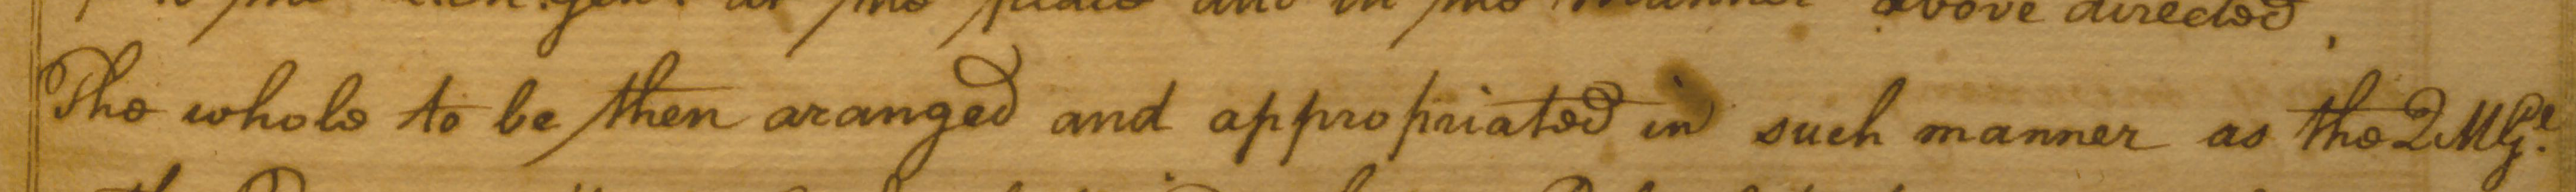The whole to be then arranged and appropriated in such manner as the QMG^l.
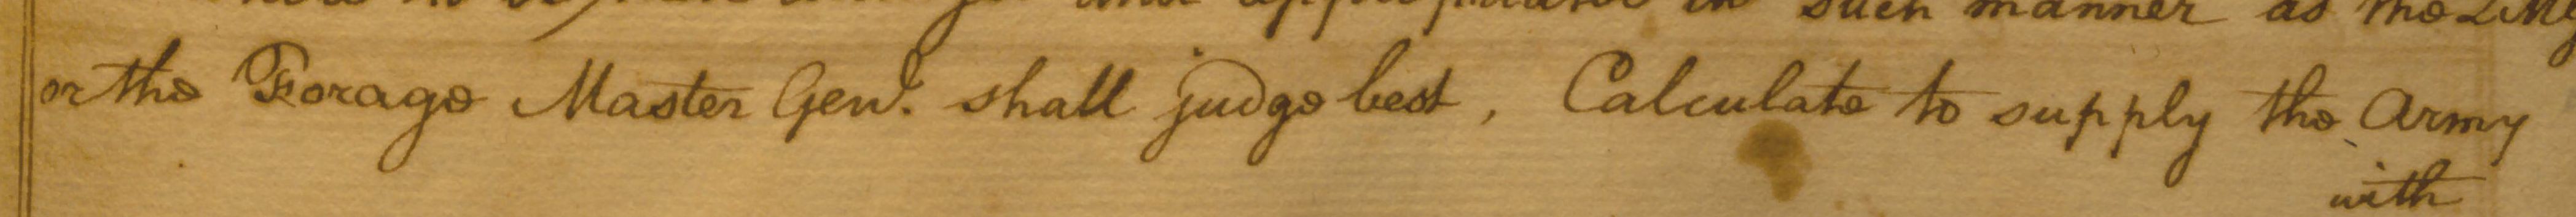or the Forage master Gen^l. shall judge best. Calculate to supply the Army
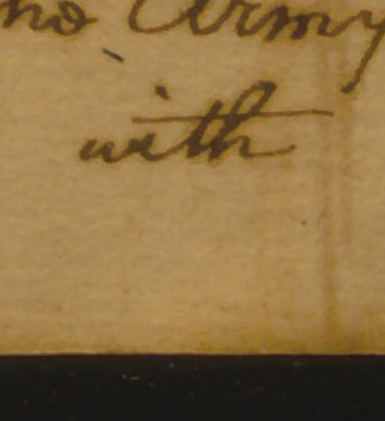with
